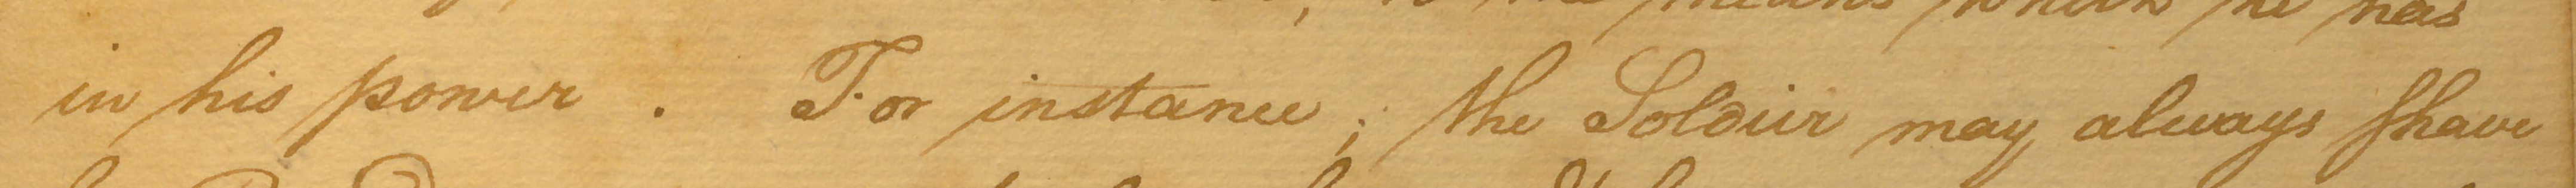in his power. For instance; the Soldier may always shave
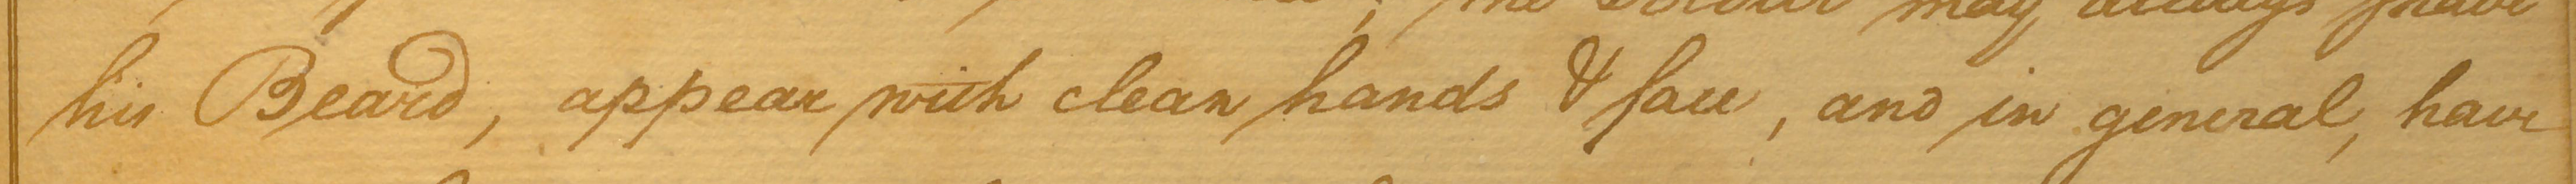his Beard, appear with clean hands & face, and in general, have
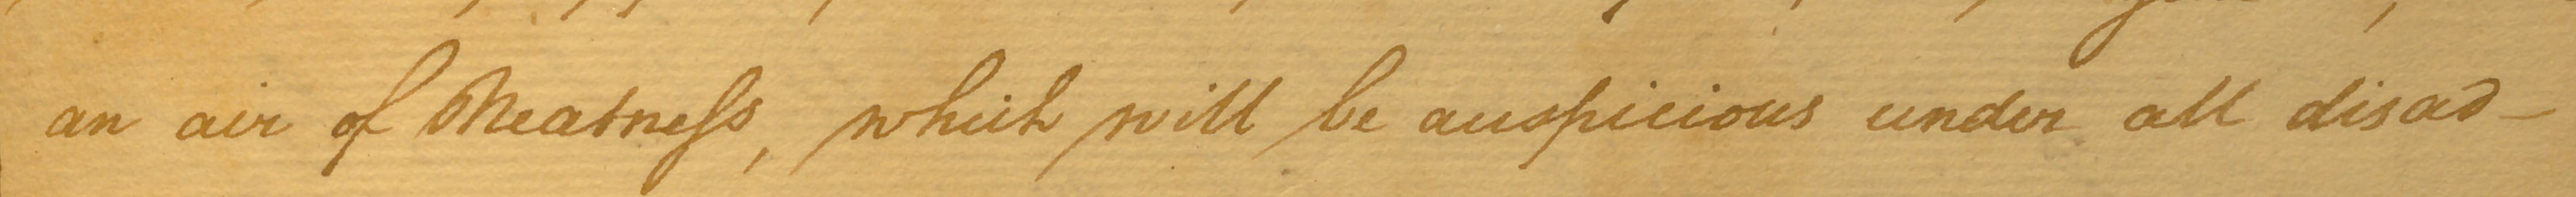an air of Neatness, which will be auspicious under all disad-
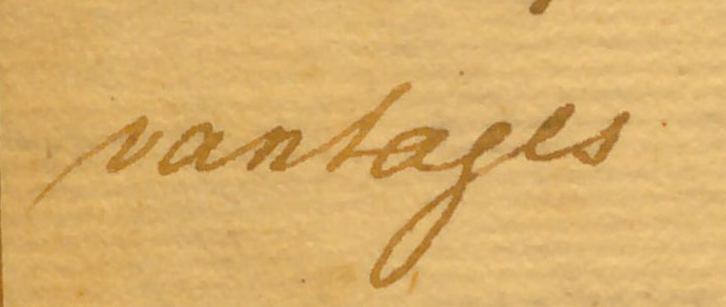vantages
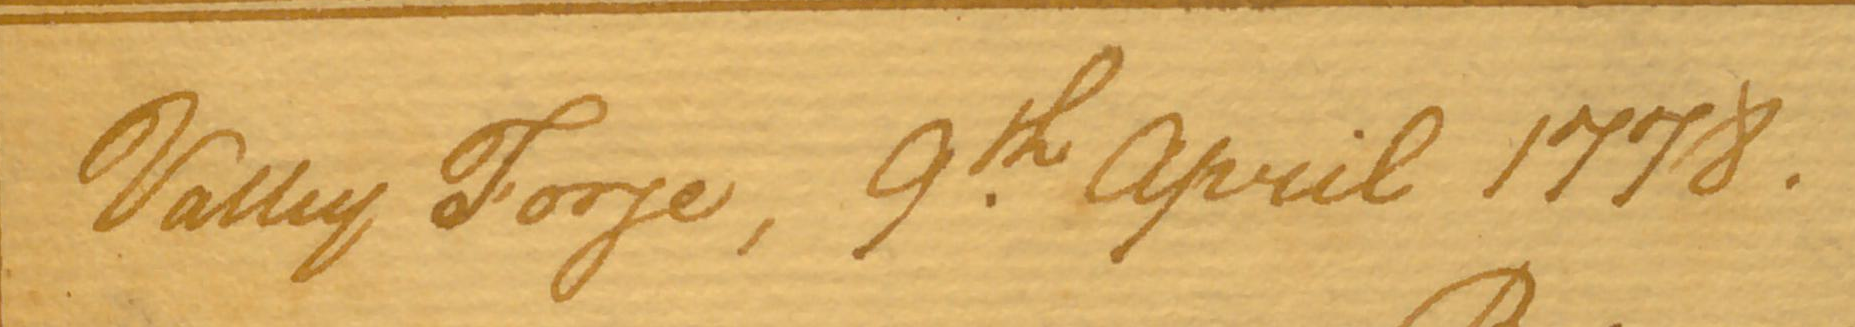Valley Forge, 9^th. April 1778.
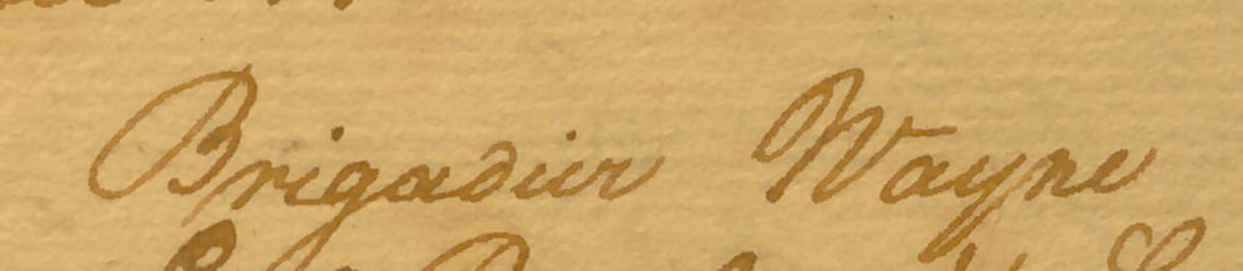Brigadier Wayne
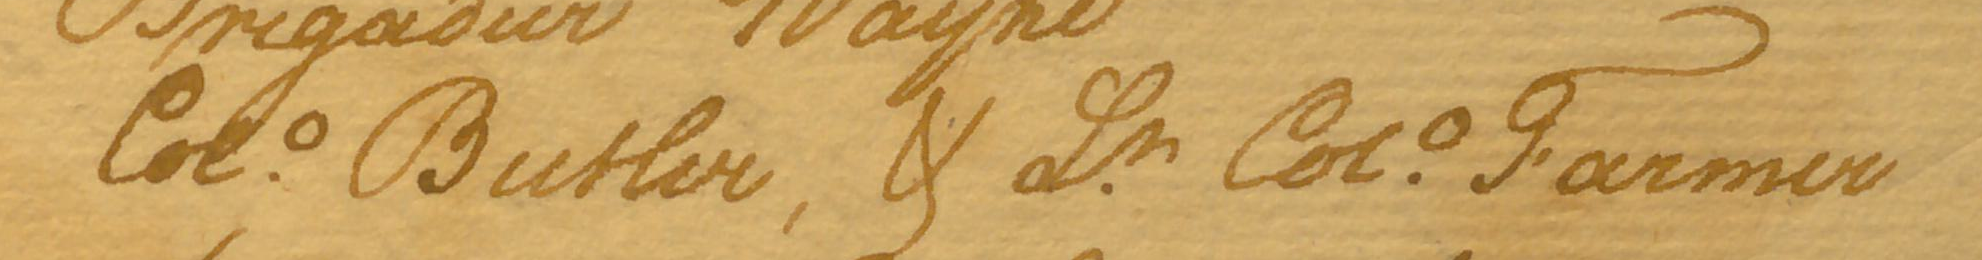Col^o. Butler, & L^t. Col^o. Farmer
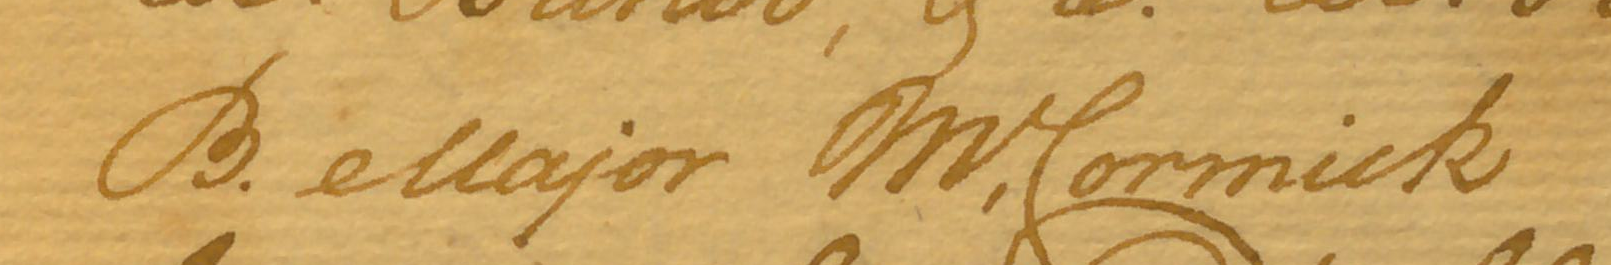B. Major M^c.Cormick
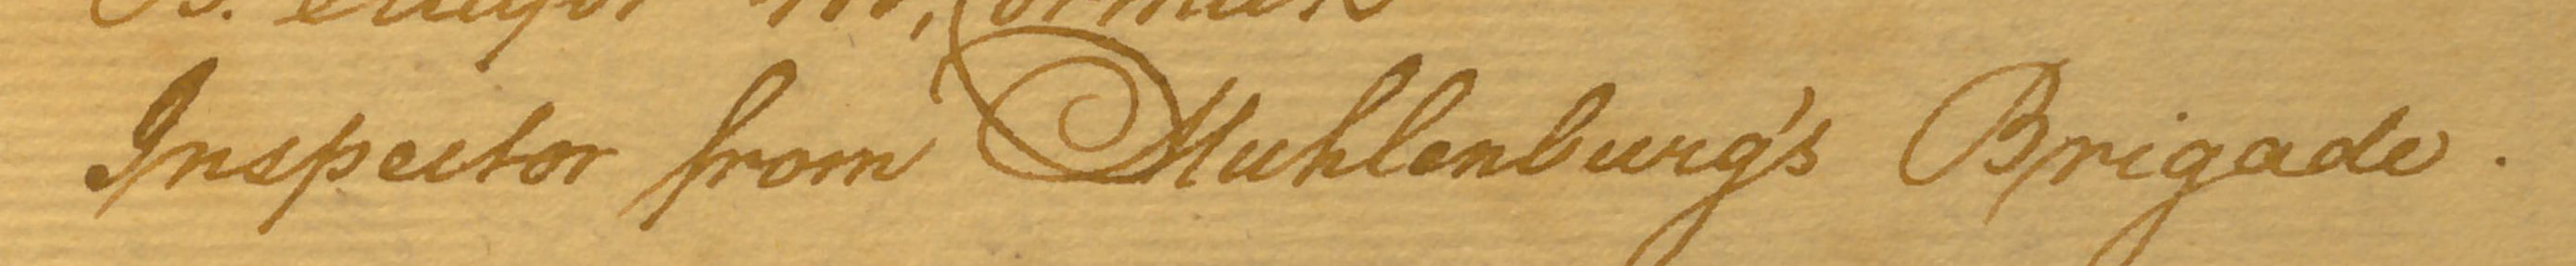Inspector from Muhlenburg's Brigade.
